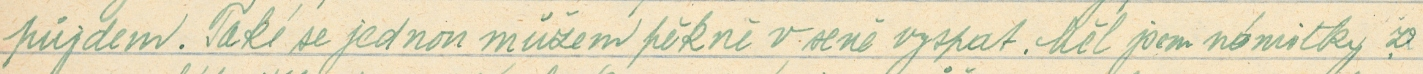půjdem. Také se jednou můžem pěkně v seně vyspat. Měl jsem námitky že
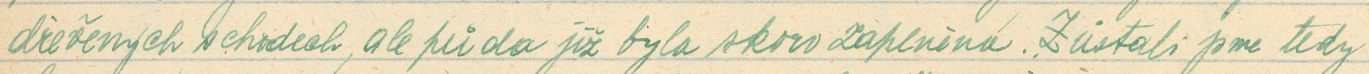dřevěných schodech, ale půda již byla skoro zaplněná. Zůstali jsme tedy
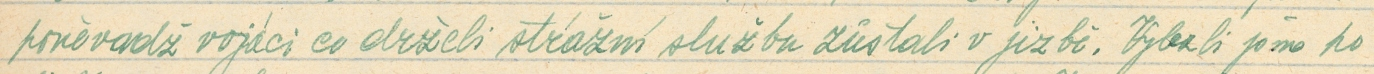poněvadž vojáci co drželi strážní službu zůstali v jizbě. Vylezli jsme po
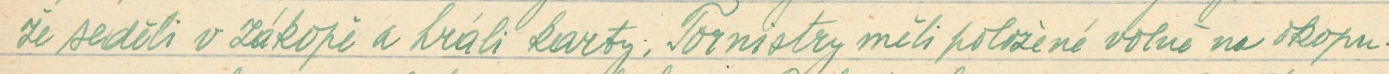že seděli v zákopě a hráli karty. Tornistry měli položené volně na okopu.
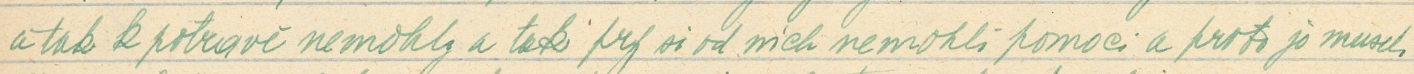a tak k potravě nemohly a tak prý si od nich nemohli pomoci a proto je museli
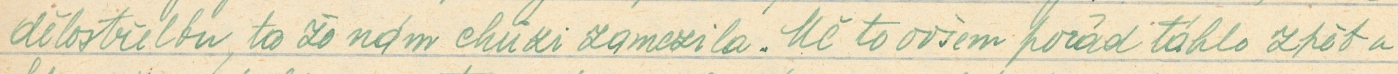dělostřelbu, ta že nám chůzi zamezila. Mě to ovšem pořád táhlo zpět a
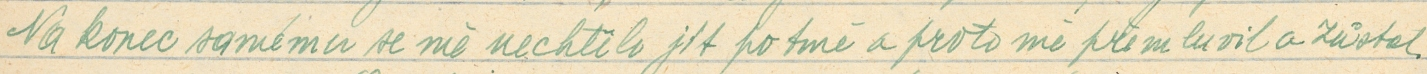Na konec samému se mě nechtělo jít po tmě a proto mě přemluvil a zůstal
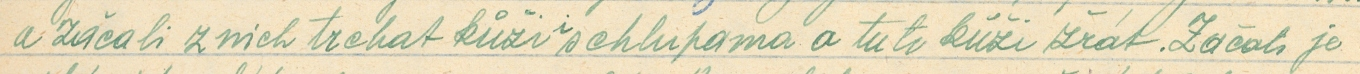a začali z nich trchat kůži i s chlupama a tuto kůži žrát. Začali je
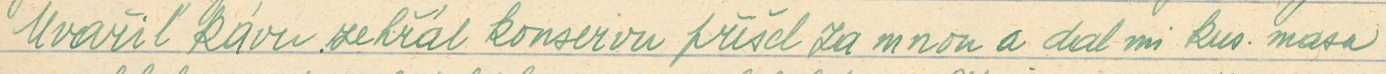Uvařil kávu zehřál konservu přišel za mnou a dal mi kus. masa
